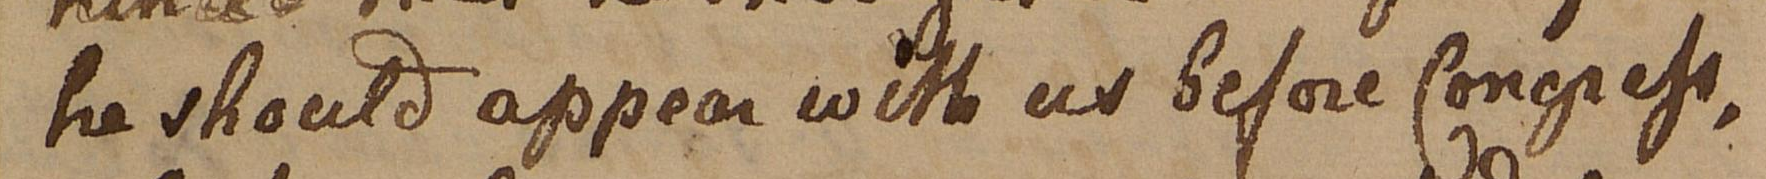he should appear with us before Congress,
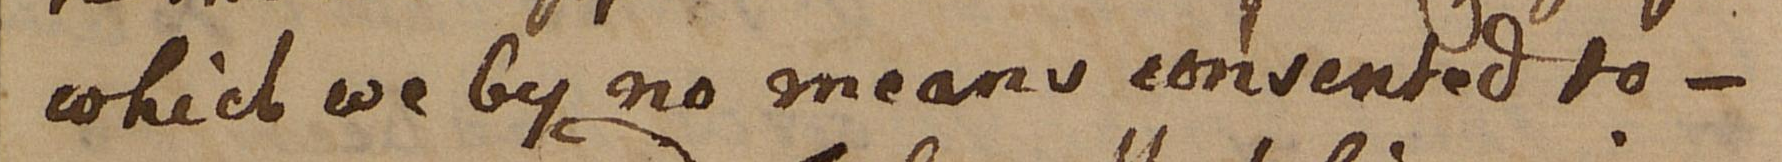which we by no means consented to-
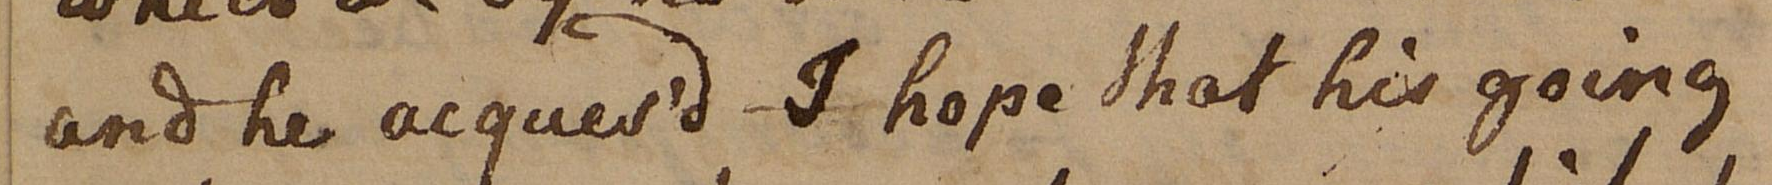and he acques'd- I hope that his going
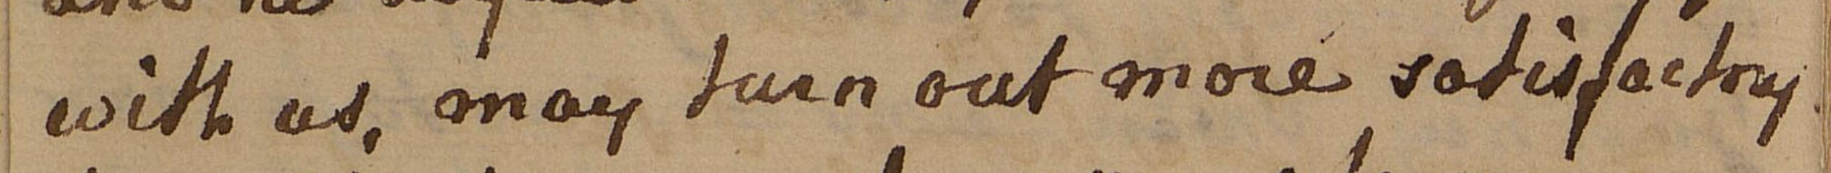with us, may turn out more satisfactory
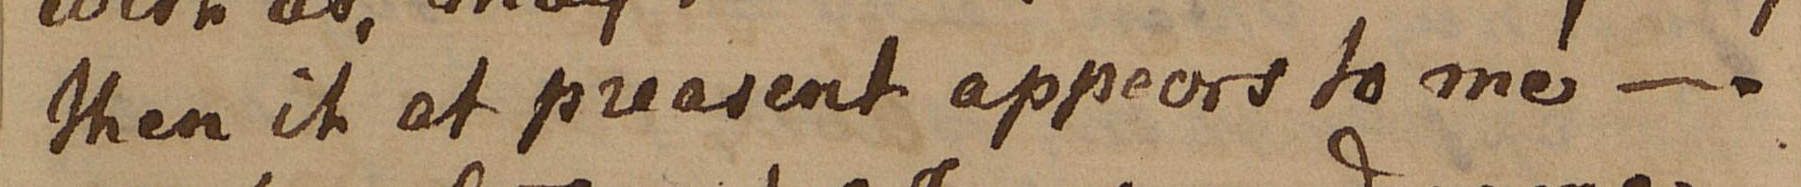then it at present appeors to me-
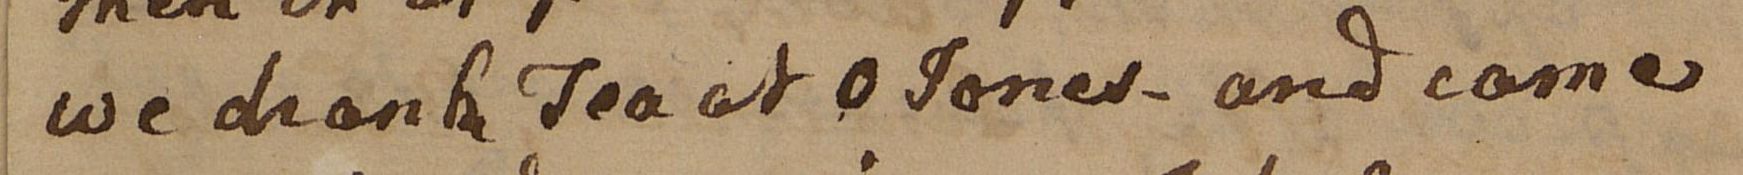we drank Tea at O Jones- and came
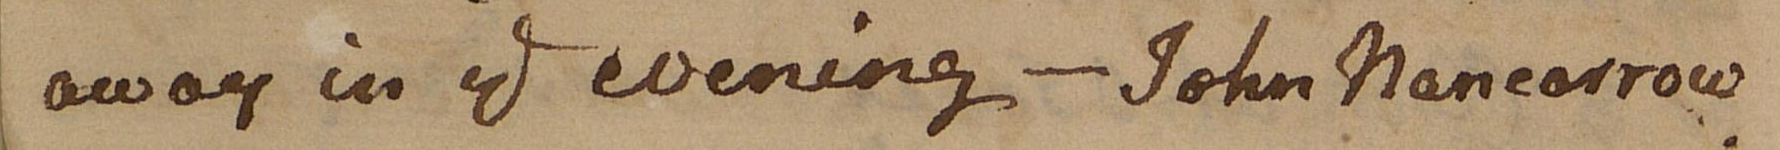away in y^e evening- John Nancarrow
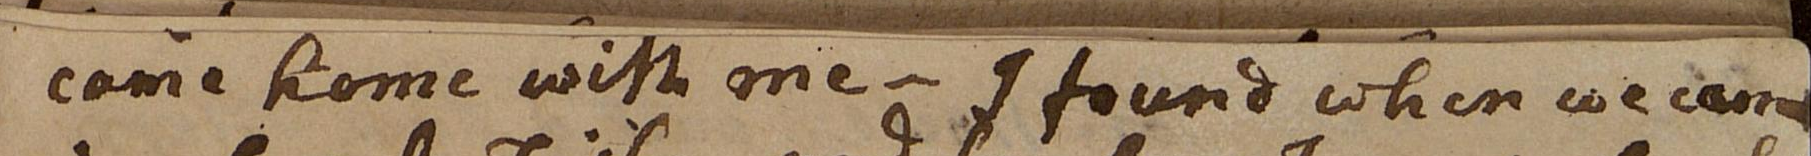came home with me- I found when we came
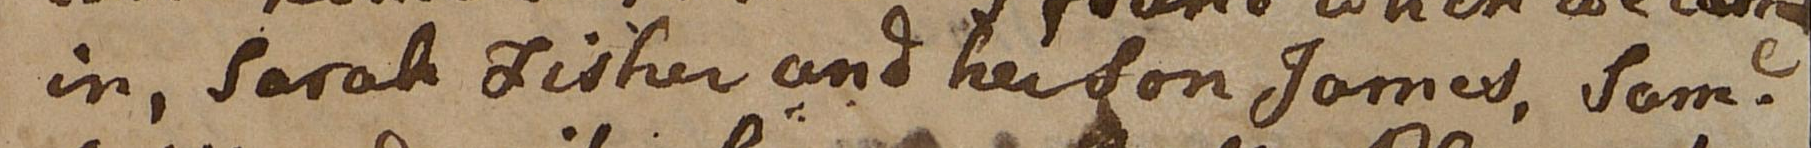in, Sarah Fisher and her Son James, Sam^l.
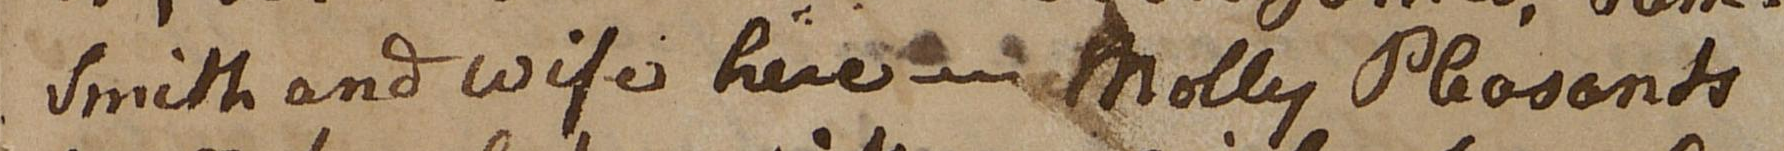Smith and Wife here-Molly Pleasants
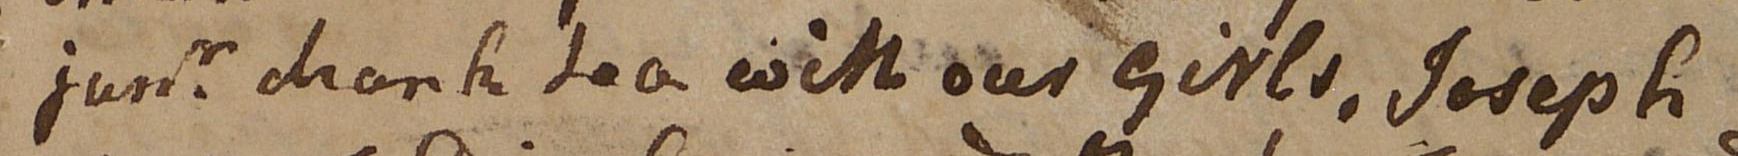jun^r. drank tea with our Girls, Joseph
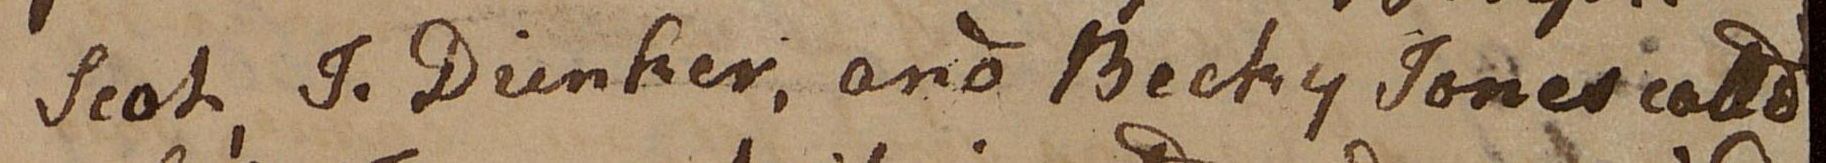Seat T. Drinker, and Becky Jones call'd
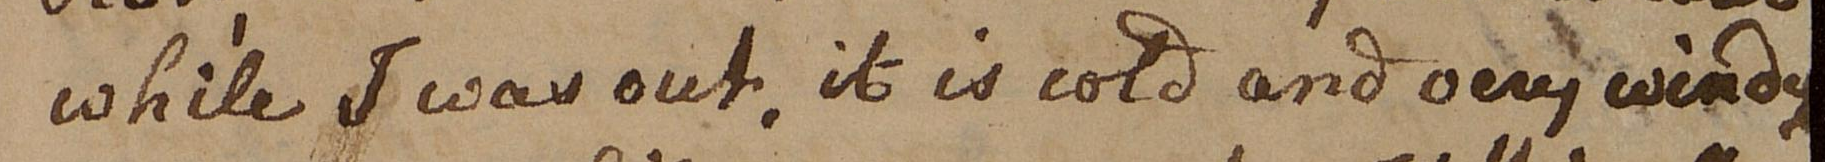while I was out, it is cold and very windy
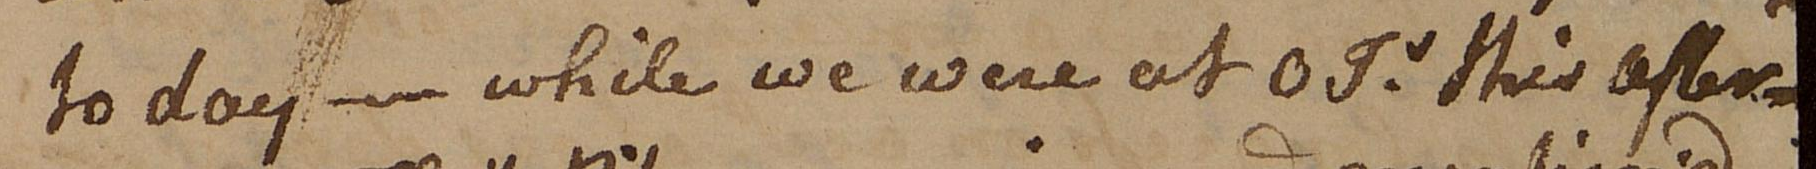to day- while we were at O J.^s this after-
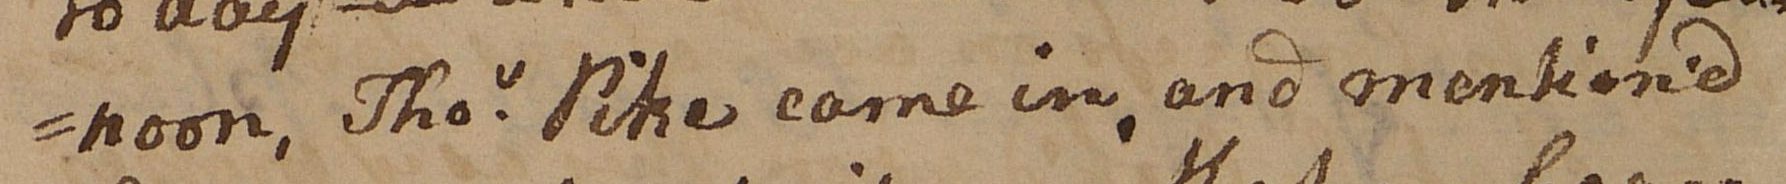-noon, Tho^s. Pike came in, and mention'd
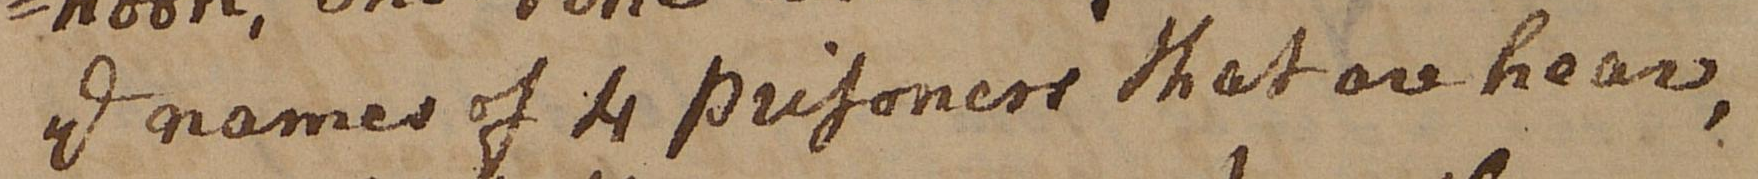y^e names of 4 prisoners that are hear,
